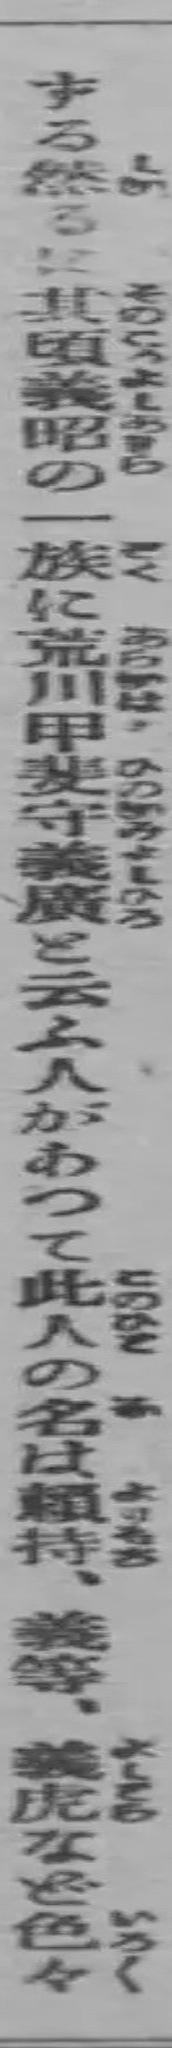荒川甲斐守ずる然るに其頃義昭の一族に荒川甲斐守義広と云ふ人があつて此人の名は頼持、義等、義虎など色々
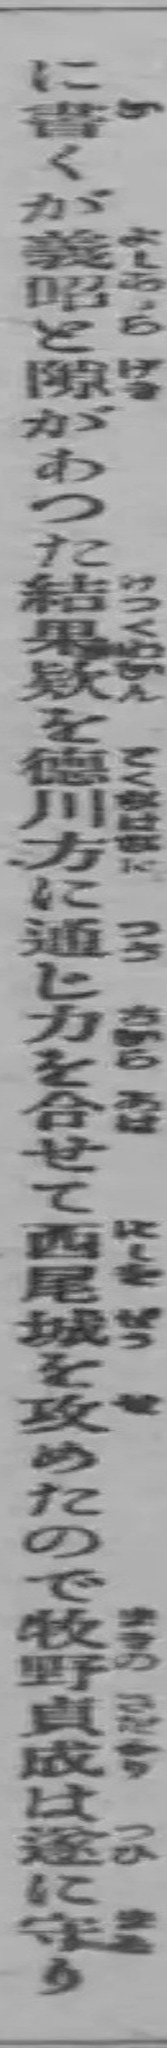に書くが義昭と隙があつた結果欵を徳川方に通じ力を合せて西尾城を攻めたので牧野貞成は遂に守り
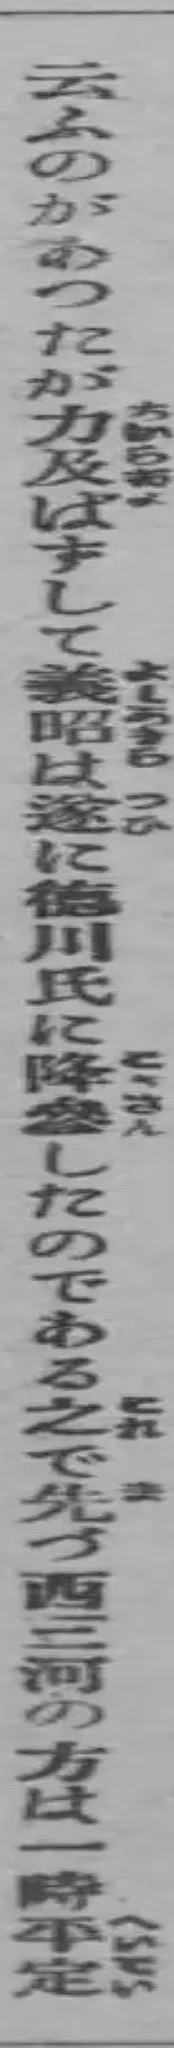云ふのがあつたが力及ばずして義昭は遂に徳川氏に降参したのである之で先づ西三河の方は一時平定
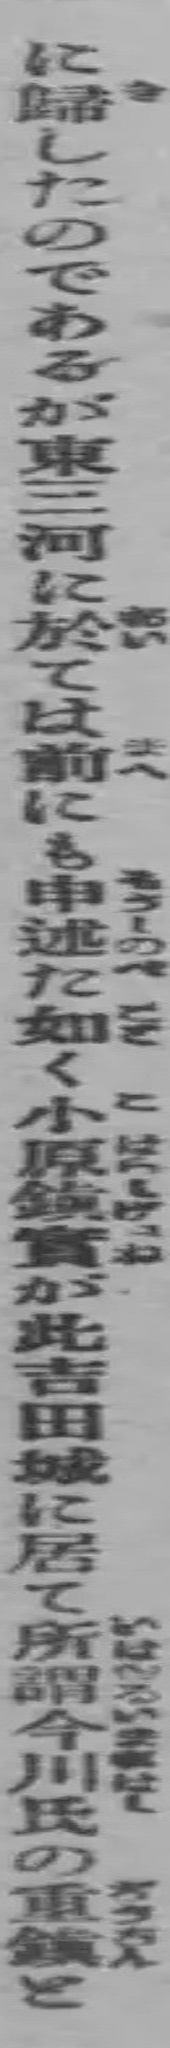に帰したのであるが東三河に於ては前にも申述た如く小原鎮実が此吉田城に居て所謂今川氏の重鎮と
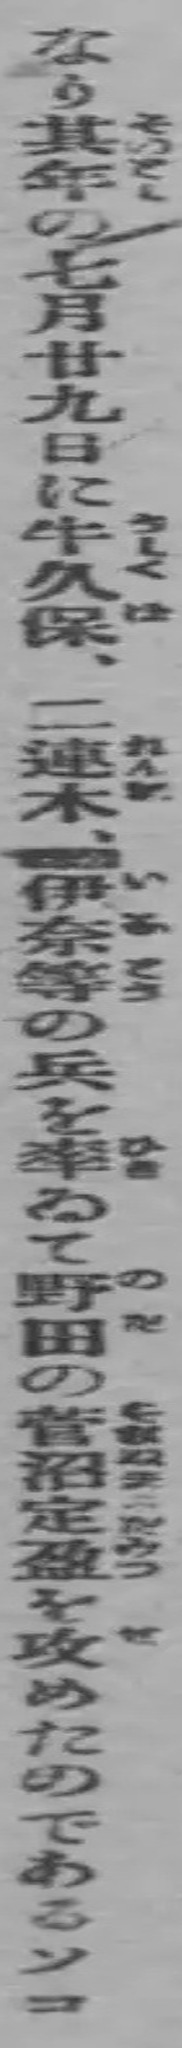野田の城なり其年の七月廿九日に牛久保、二連木、伊奈等の兵を率ゐて野田の菅沼定盈を攻めたのであるソコ

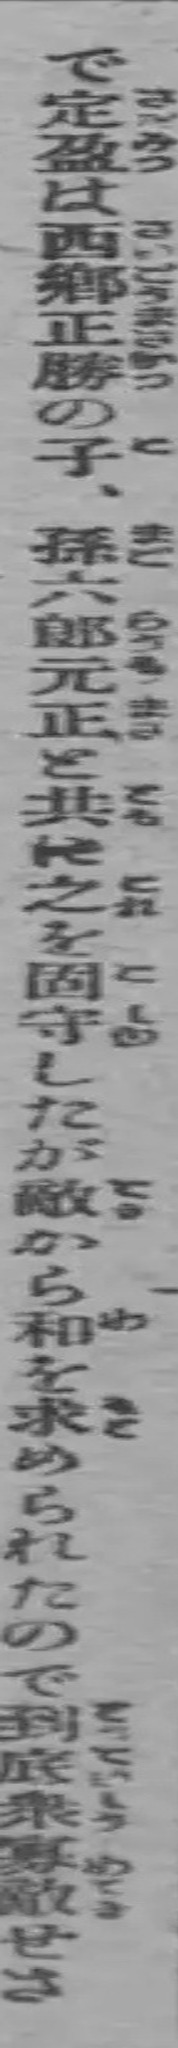で定盈は西郷正勝の子、孫六郎元正と共に之を固守したが敵から和を求められたので到底衆寡敵せさ
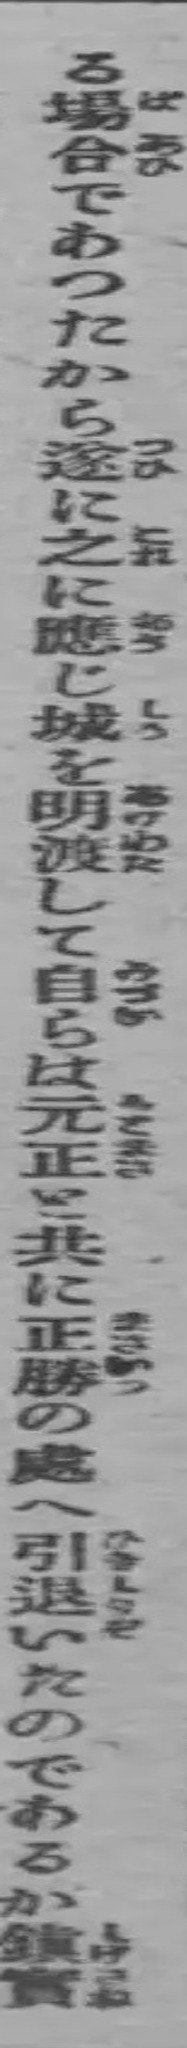る場合であつたから遂に之に応じ城を明渡して自らは元正と共に正勝の処へ引退いたのであるか鎮実
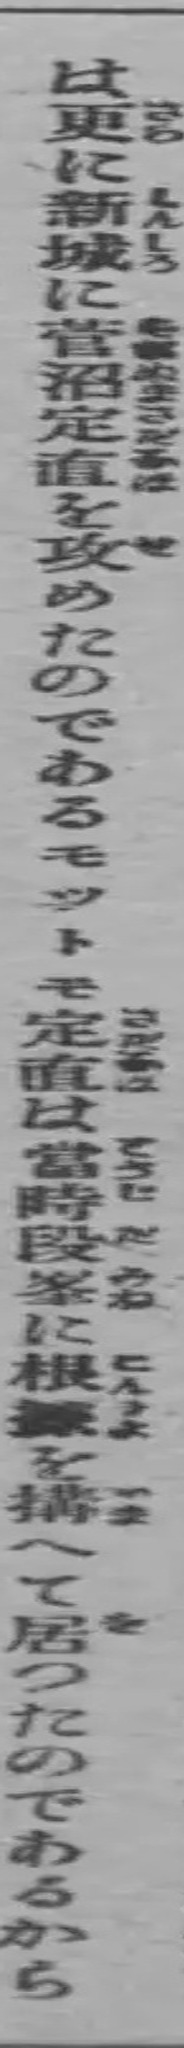は更に新城に菅沼定直を攻めたのであるモツトモ定直は当時段峯に根拠を搆へて居つたのであるから
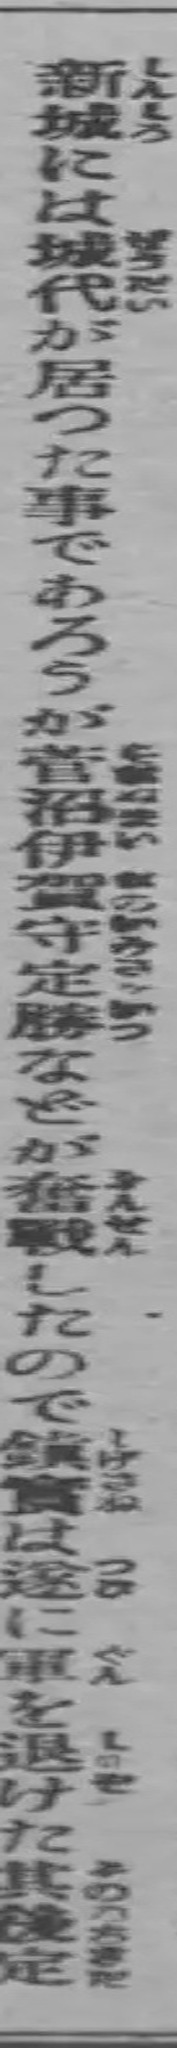新城の戦新城には城代が居つた事であろうが菅沼伊賀守定勝などが奮戦したので鎮実は遂に軍を退けた其後定
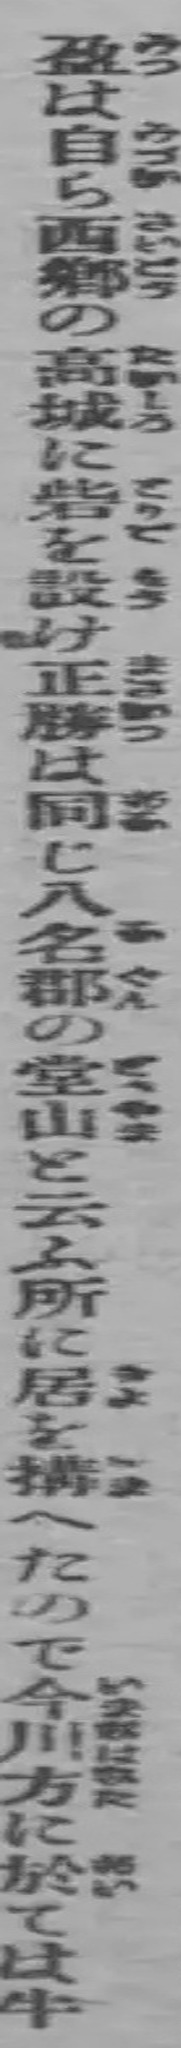盈は自ら西郷の高城に砦を設け正勝は同じ八名郡の堂山と云ふ所に居を搆へたので今川方に於ては牛
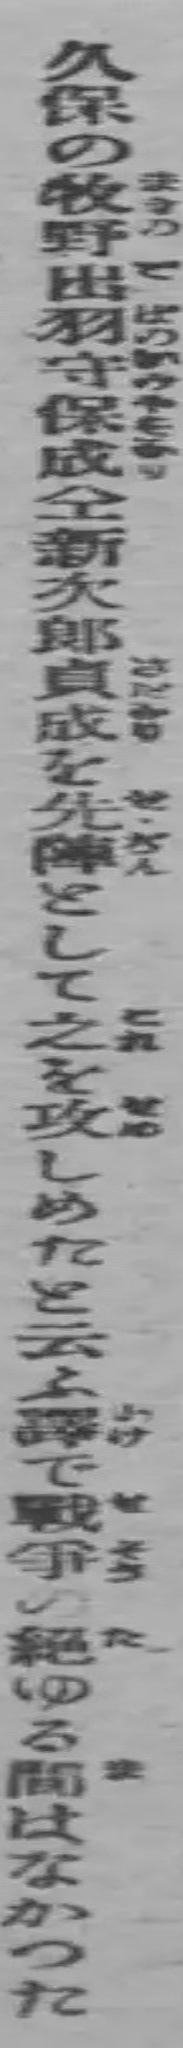久保の牧野出羽守保成仝新次郎貞成を先陣として之を攻しめたと云ふ訳で戦争の絶ゆる間はなかつた
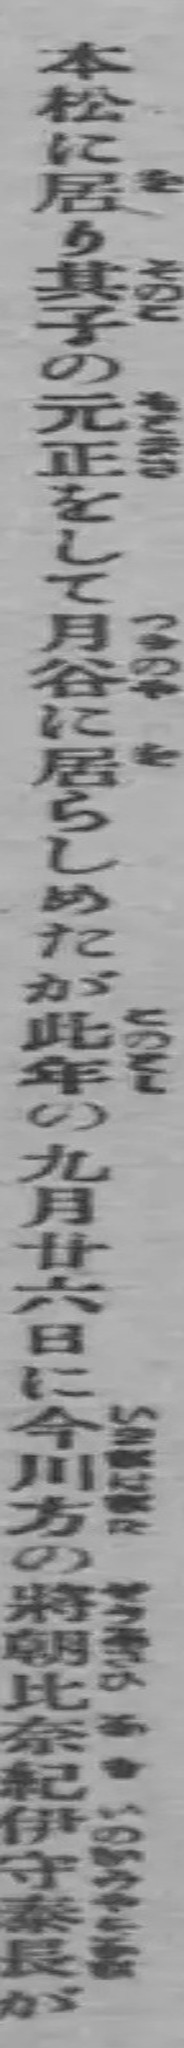本松に居り其子の元正をして月谷に居らしめたが此年の九月廿六日に今川方の将朝比奈紀伊守泰長が
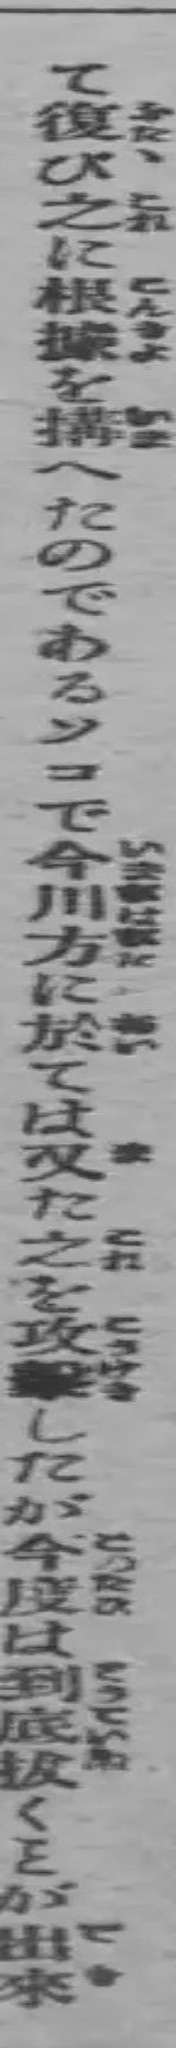て復び之に根拠を搆へたのであるソコで今川方に於ては又た之を攻撃したが今度は到底抜くことが出来
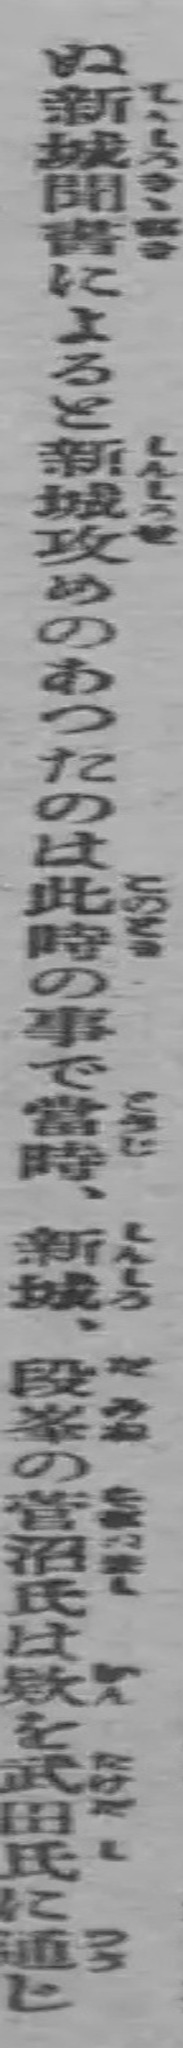ぬ新城聞書によると新城攻めのあつたのは此時の事で当時、新城、段峯の菅沼氏は欵を武田氏に通じ
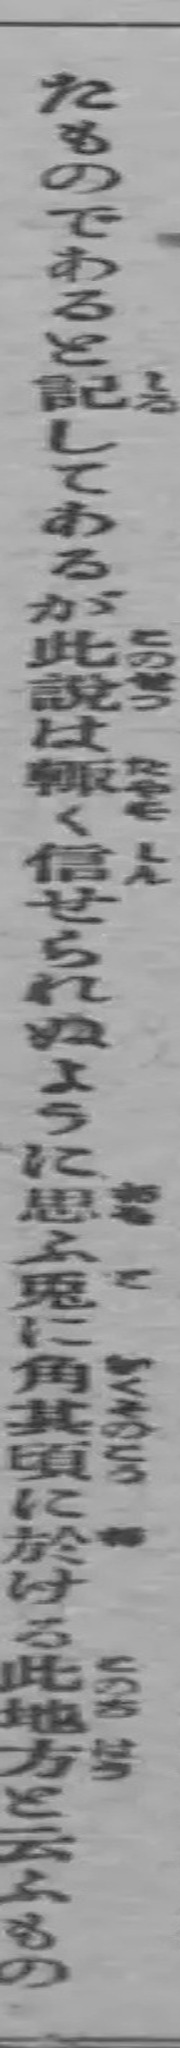たものであると記してあるが此説は輙く信せられぬように思ふ兎に角其頃に於ける此地方と云ふもの
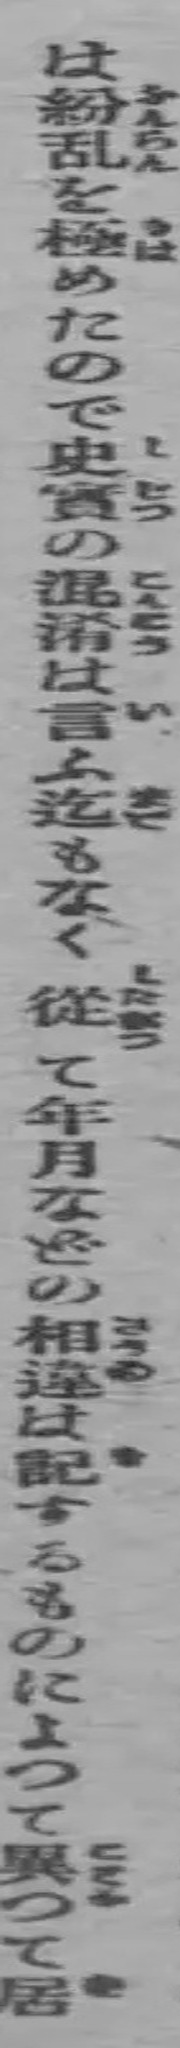は紛乱を極めたので史実の混淆は言ふ迄もなく従て年月などの相違は記するものによつて異つて居
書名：豊橋市史談
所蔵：国立国会図書館 National Diet Library, JAPAN
